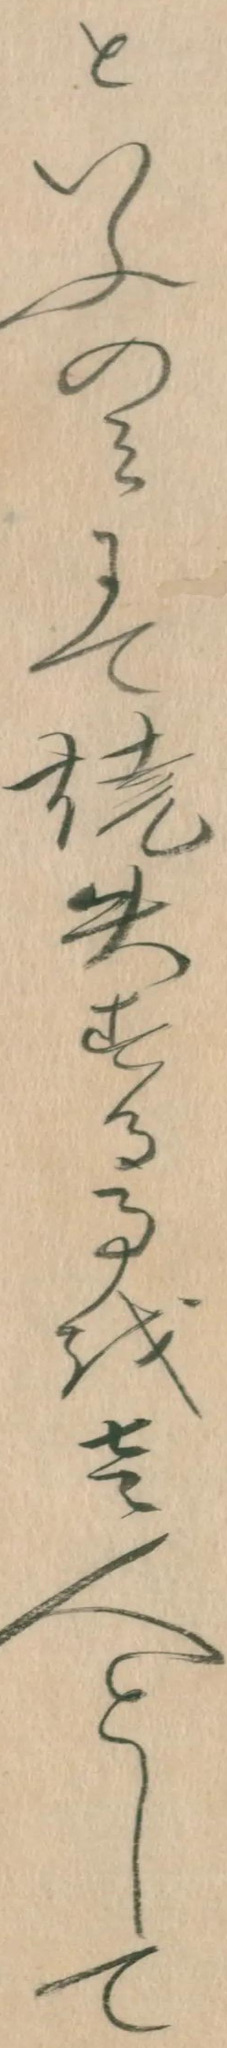といふのみにて焼失する事を壱人として
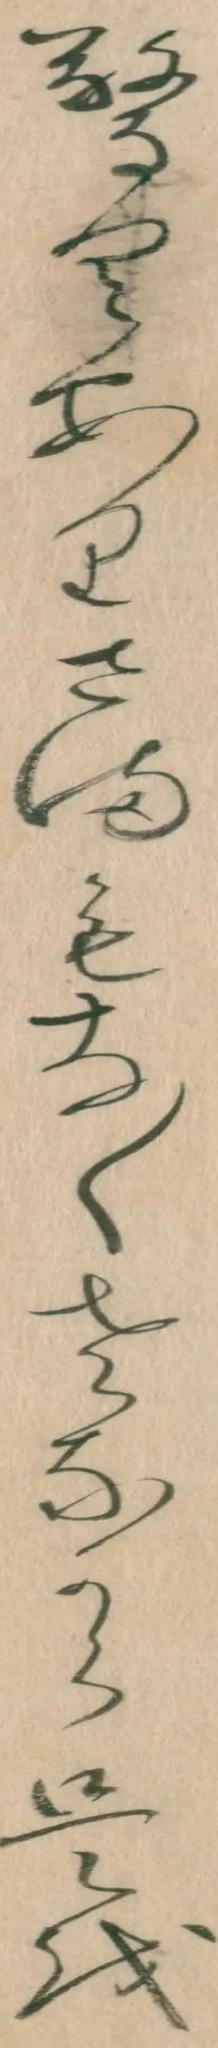驚くありさまもなくさなから是を
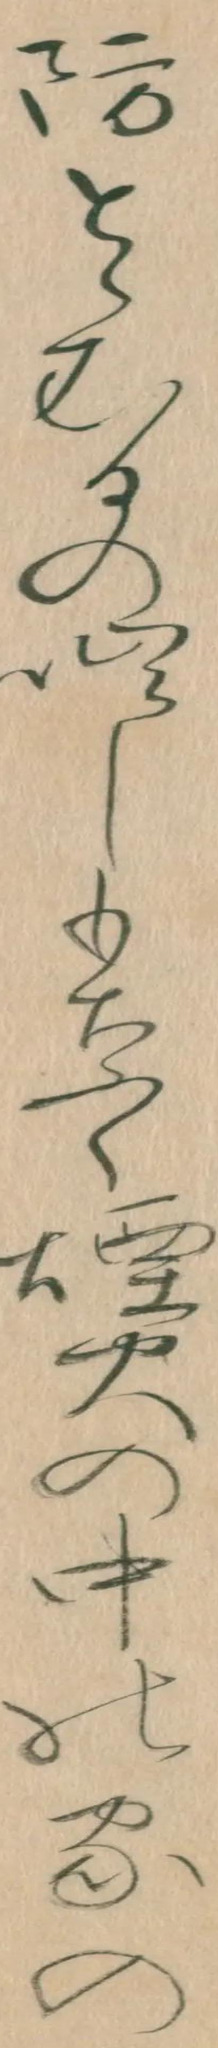防とゝむるの咄しもなく煙火の中の家の
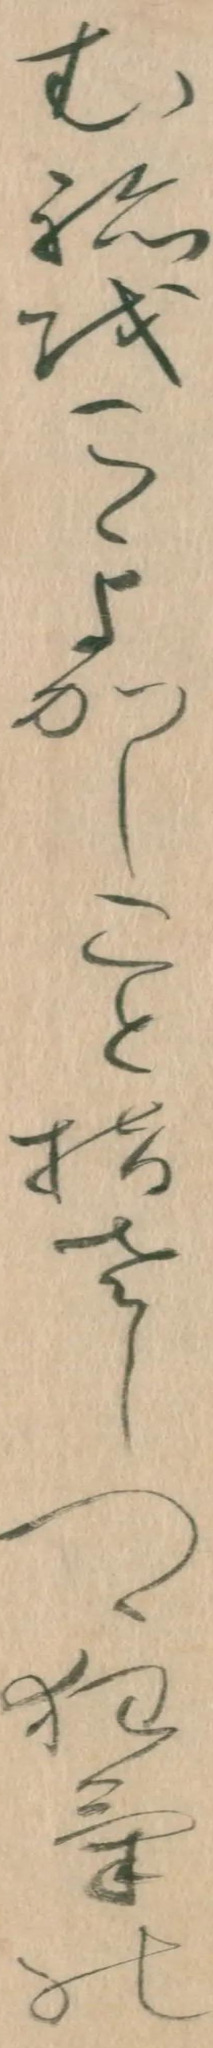むねをこゝよかしこと指さしつゝ狂気の
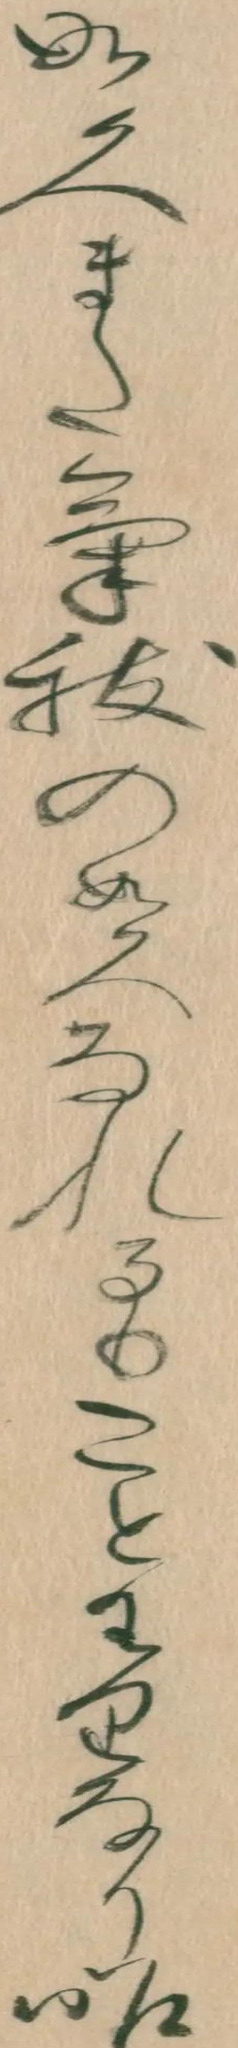如くまた気抜の如くなれるもことわりなり昨
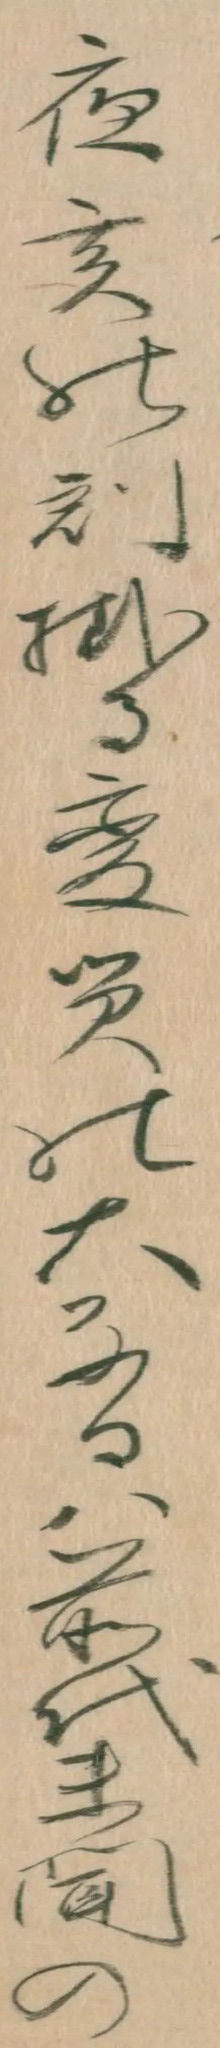夜亥の刻掛る変災の大なるは前代未聞の
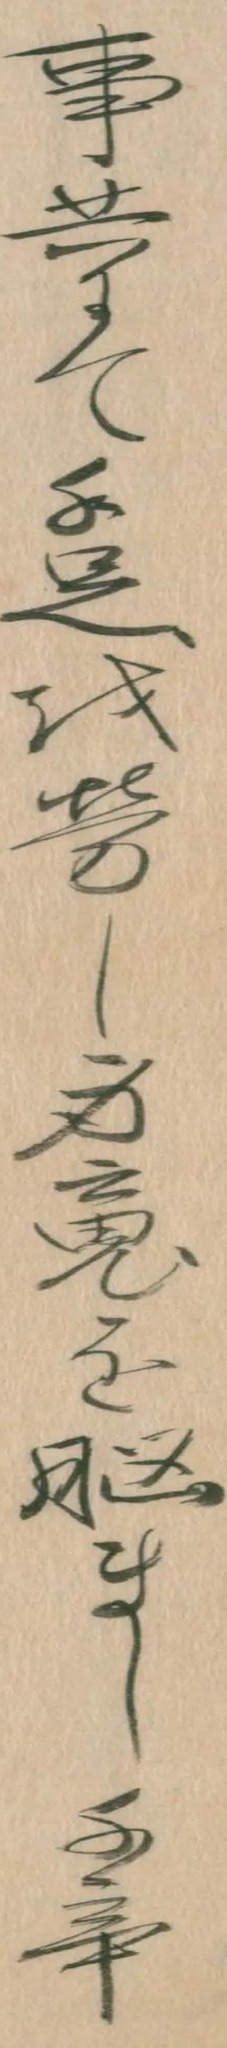事共にて手足を労し身魂を悩まし千辛
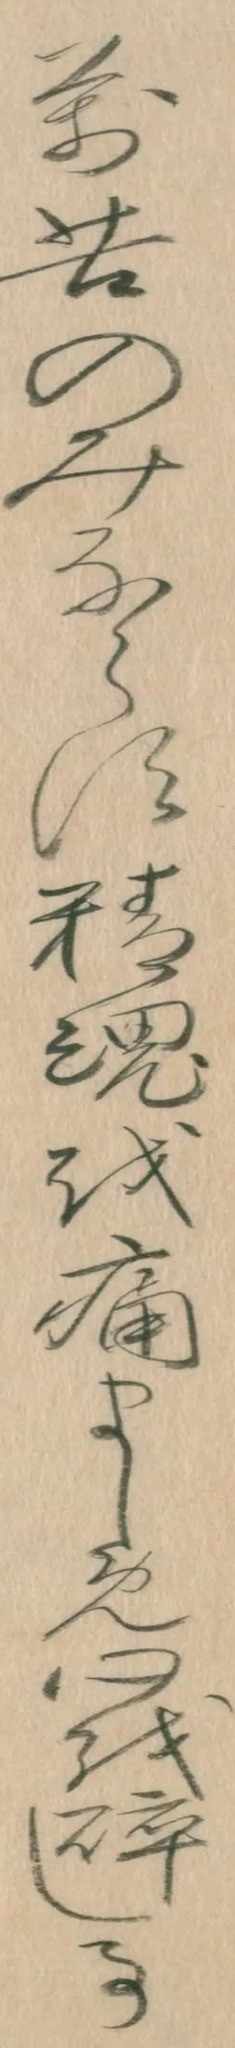万苦のみならす精魂を痛ましめ心を砕し事
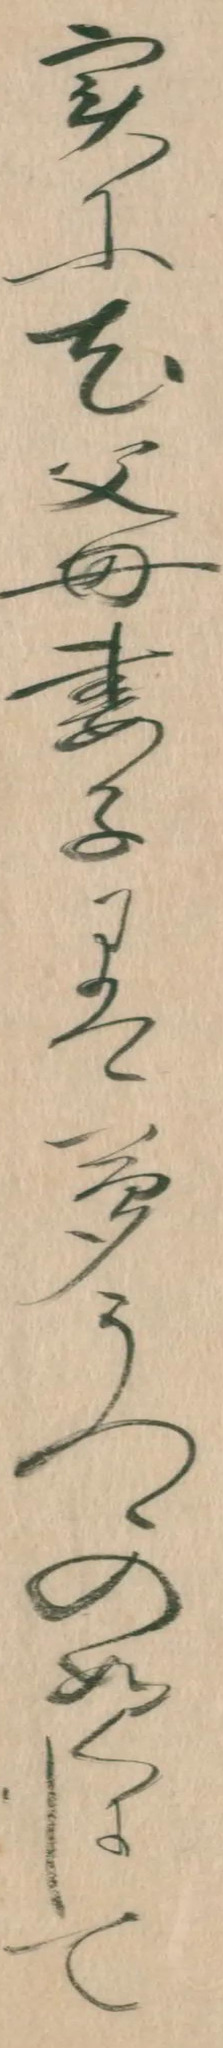実に尤父母妻子には夢うつゝの如くにして
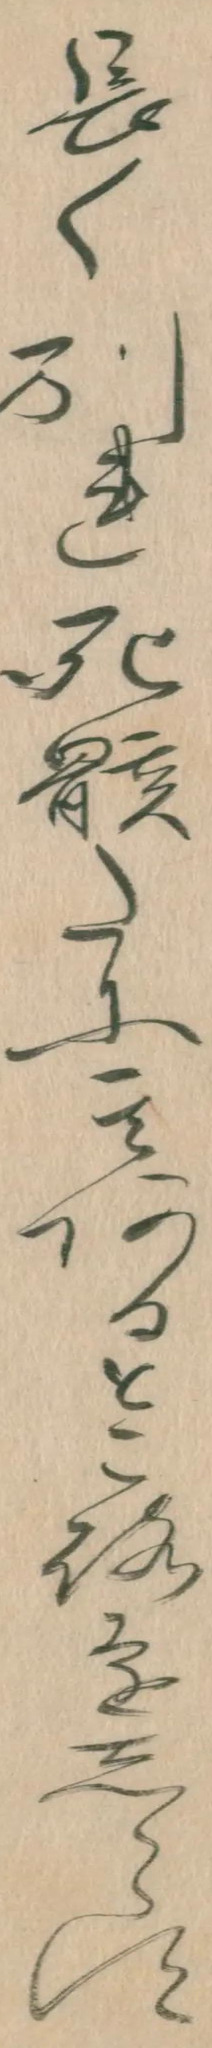長く別れ死骸たに其あるところをしらす
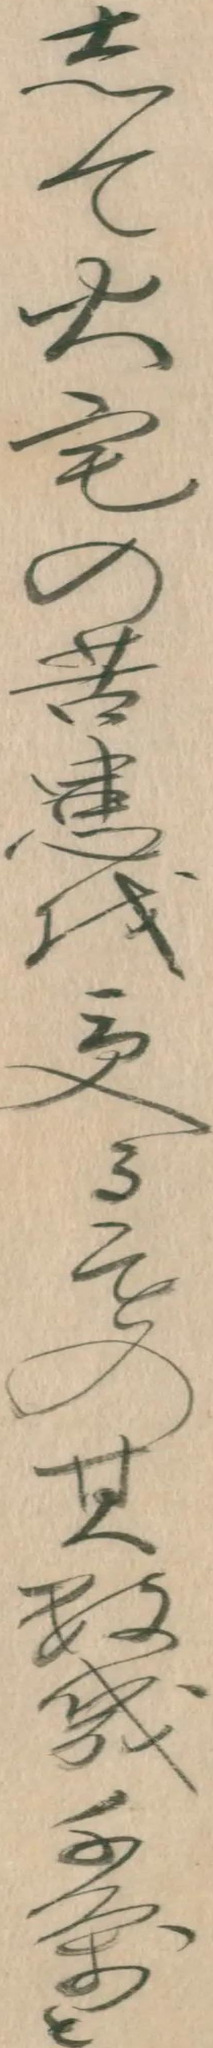して火宅の苦患を受るもの其数幾千万と
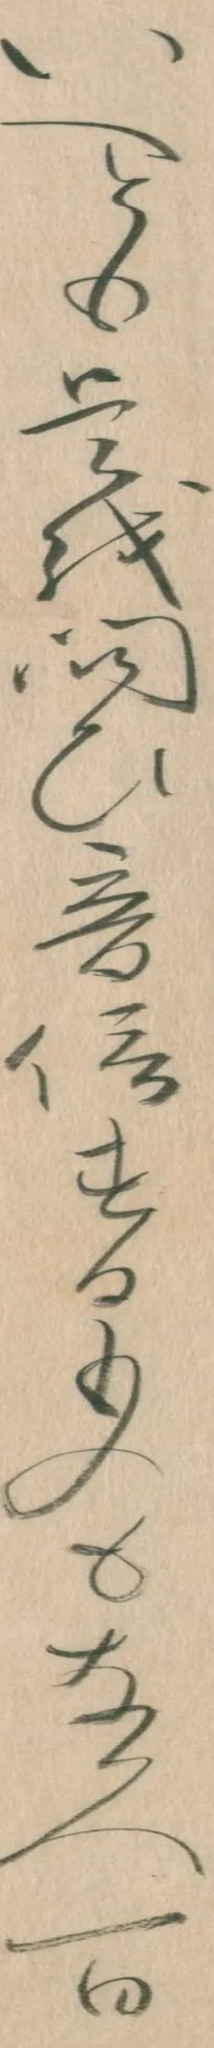いへとも是を問ひ音信するものもなく一日
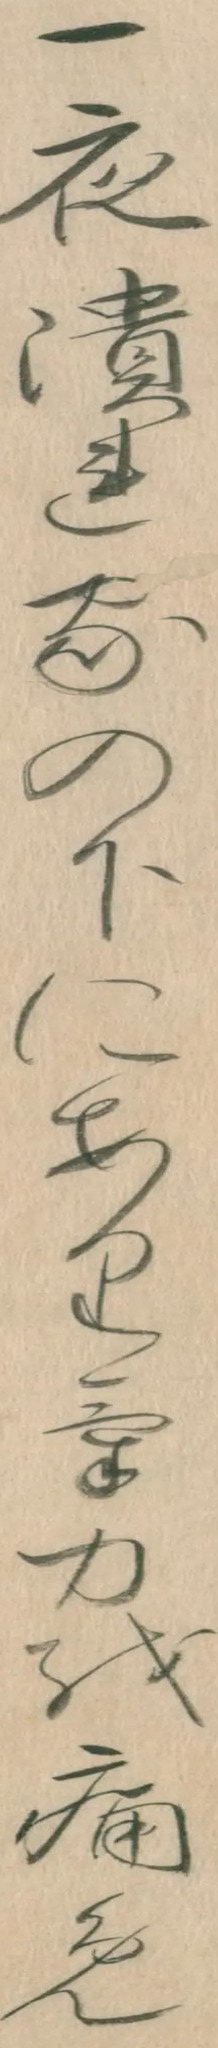一夜潰れ家の下にあり気力を痛め
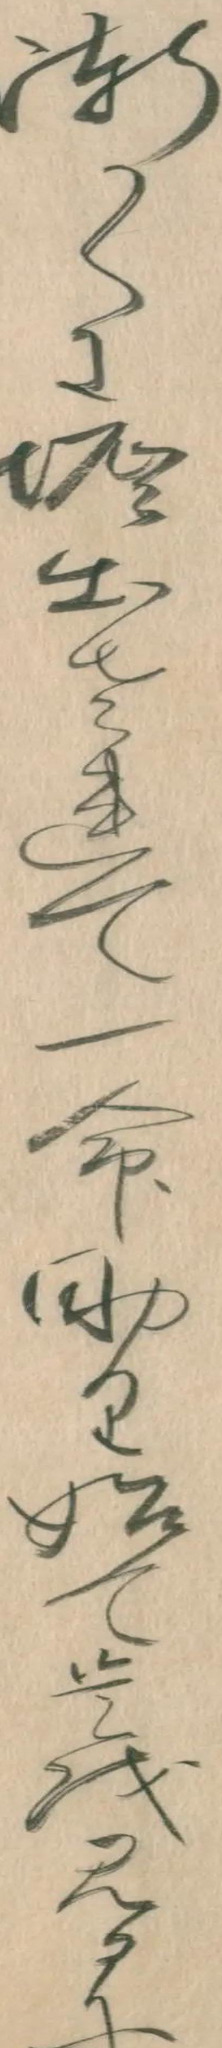漸〳〵に堀出されて一命助り始て是を見るに
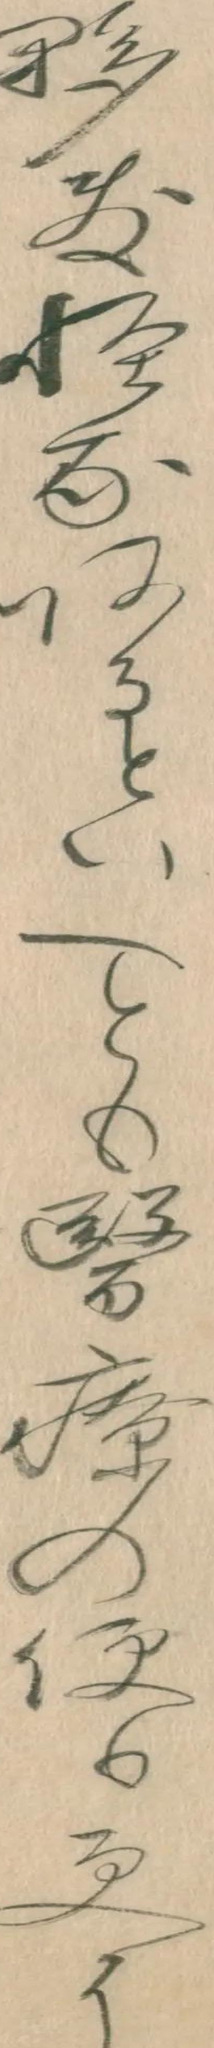夥敷怪我あるといへとも医療の便も更に
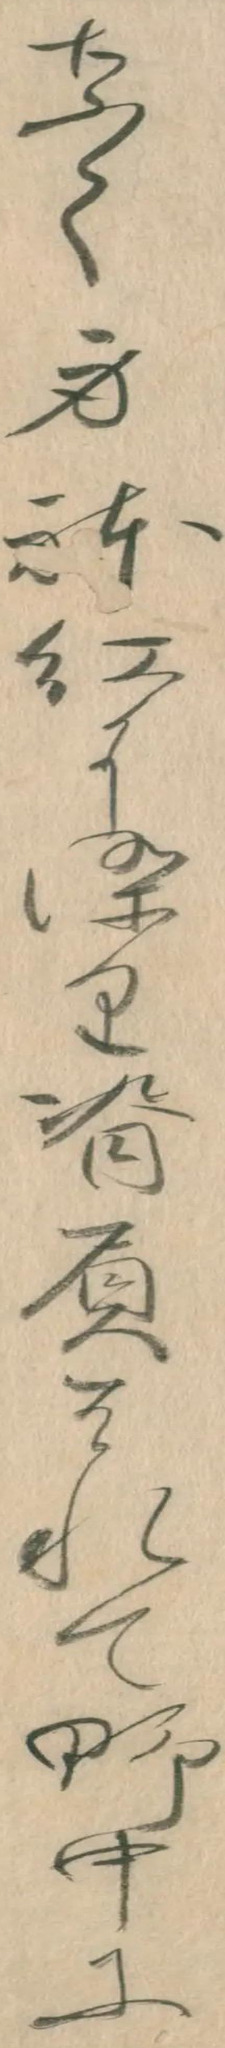なく身体紅に染り背負はれて野中に
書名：俗語之種. [4]
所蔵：国立国会図書館 National Diet Library, JAPAN
